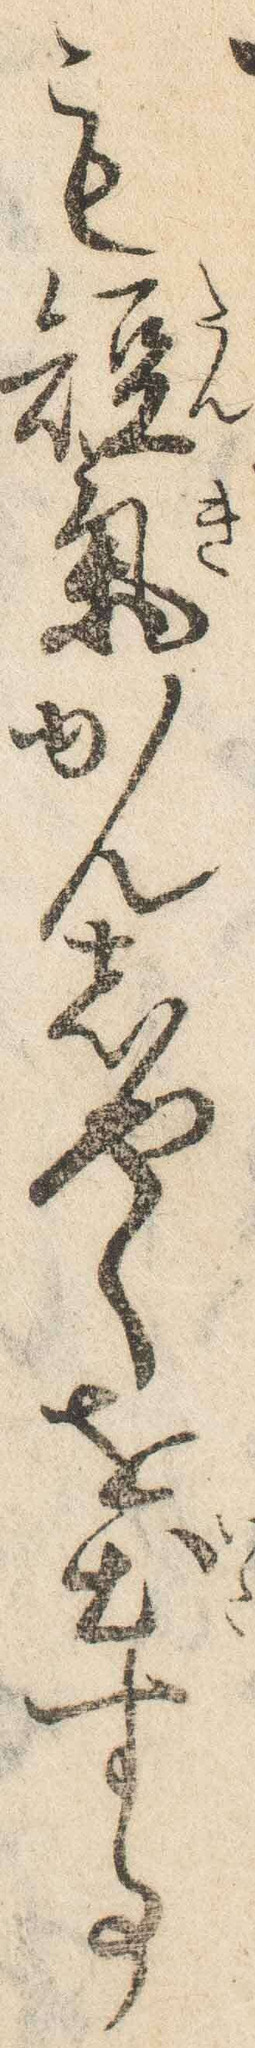も短気かんしやくを出す事
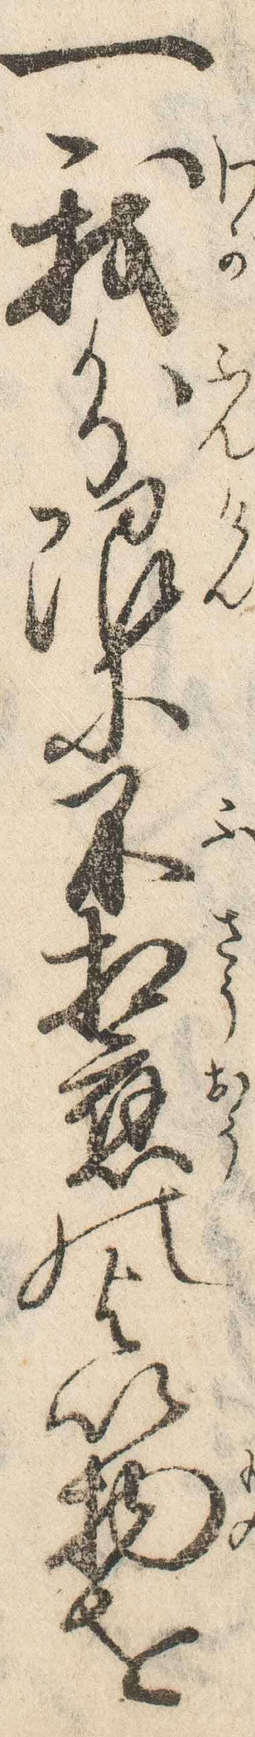一我分限に不相応のよい物を
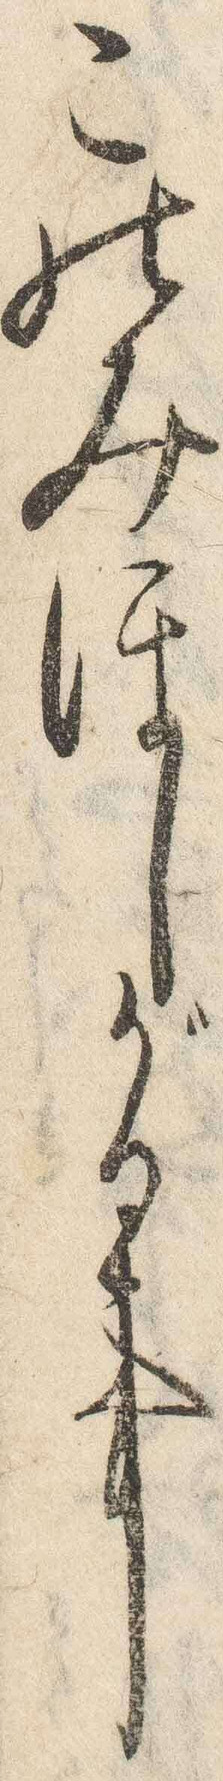このみほしがる事
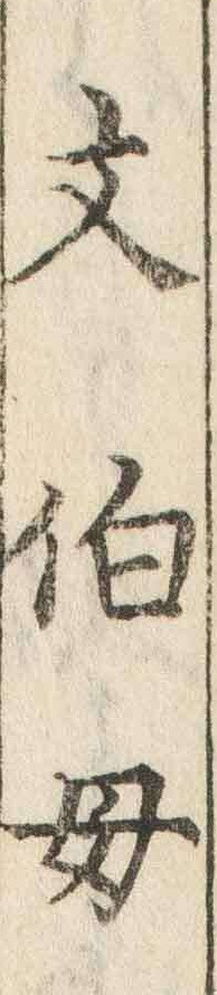文伯母
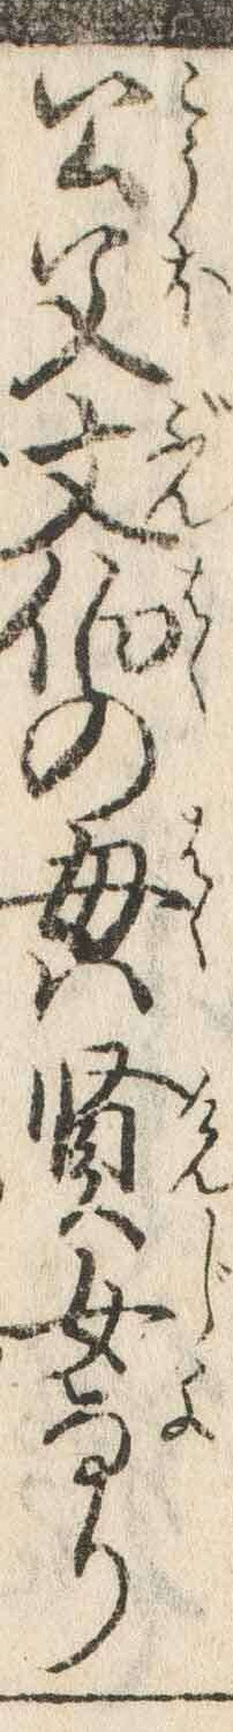公父文伯の母は賢女なり
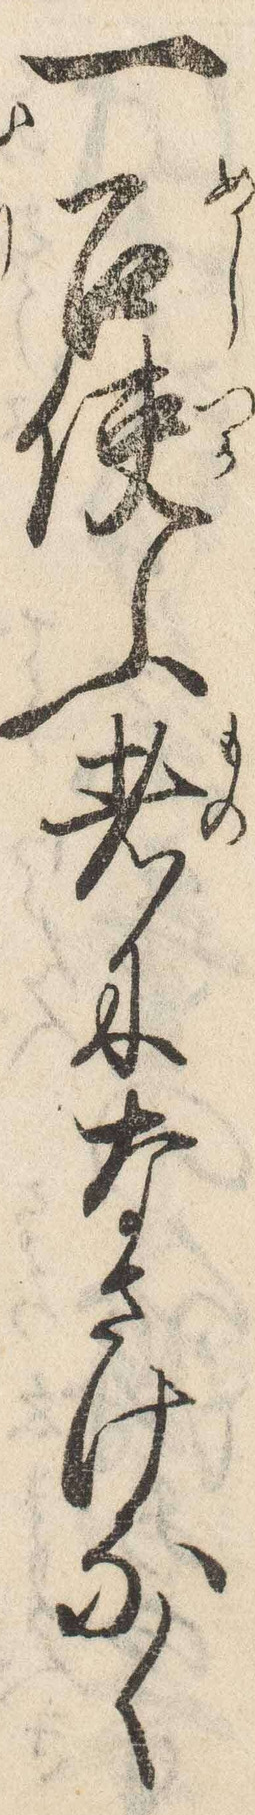一召使ふ者になさけなく
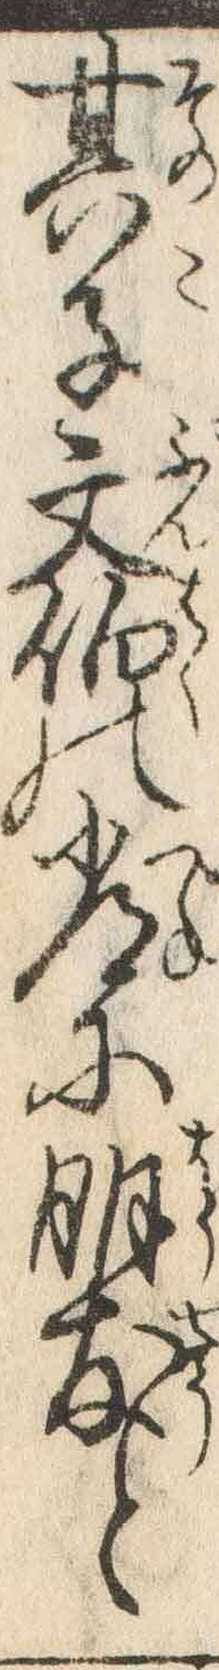其子文伯の常に朋友と
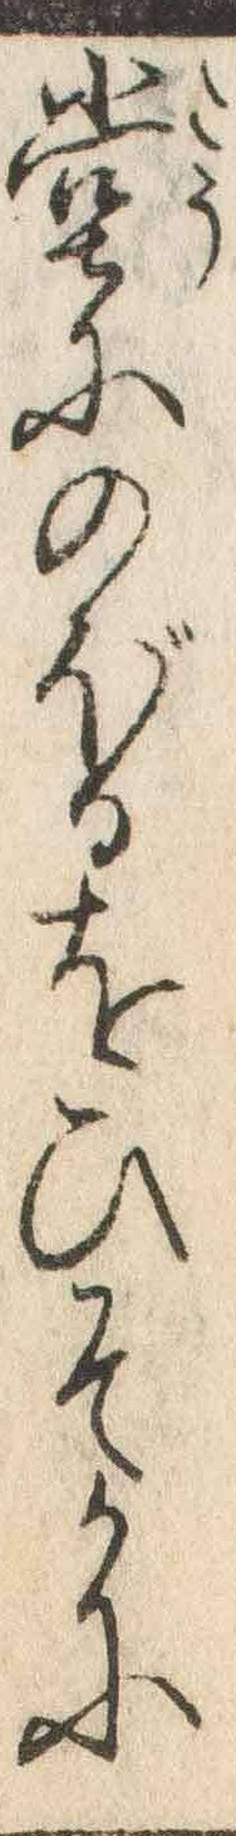堂にのぼるをひそかに
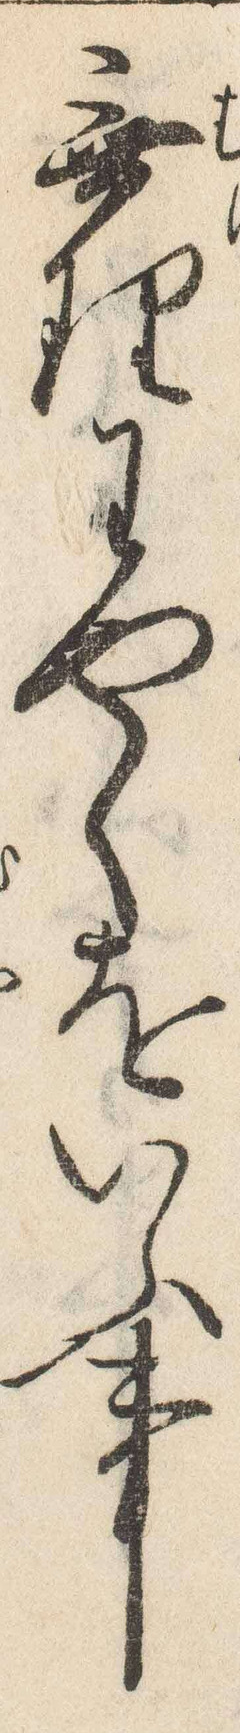無理わやくをいふ事
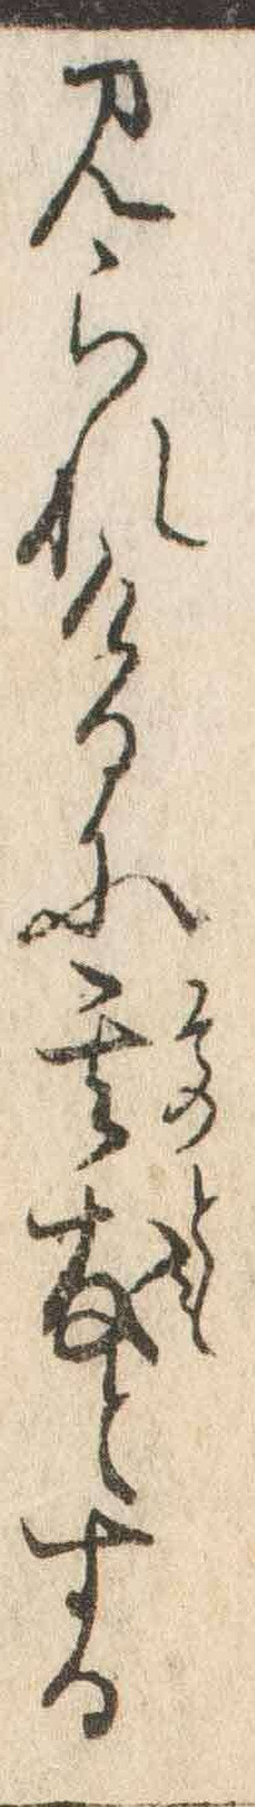見られけるに其友とする
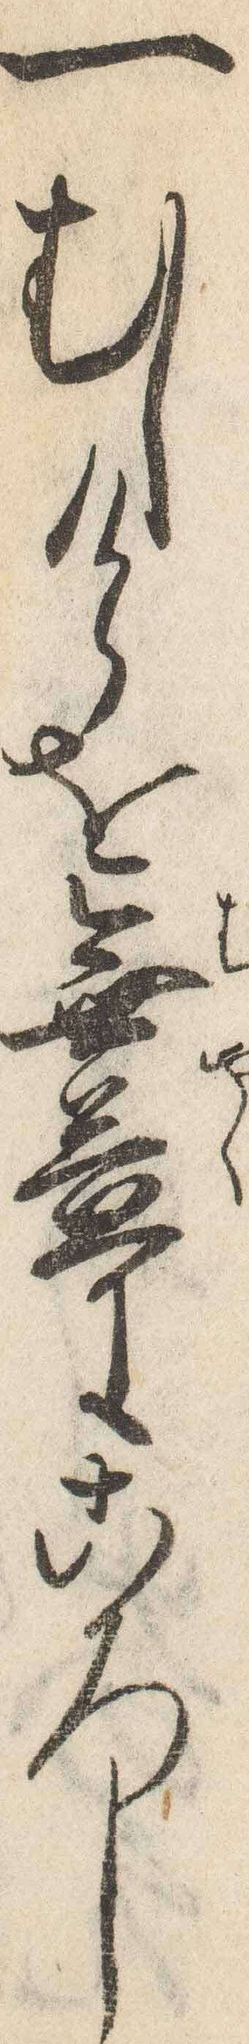一むしけらを無益にころし
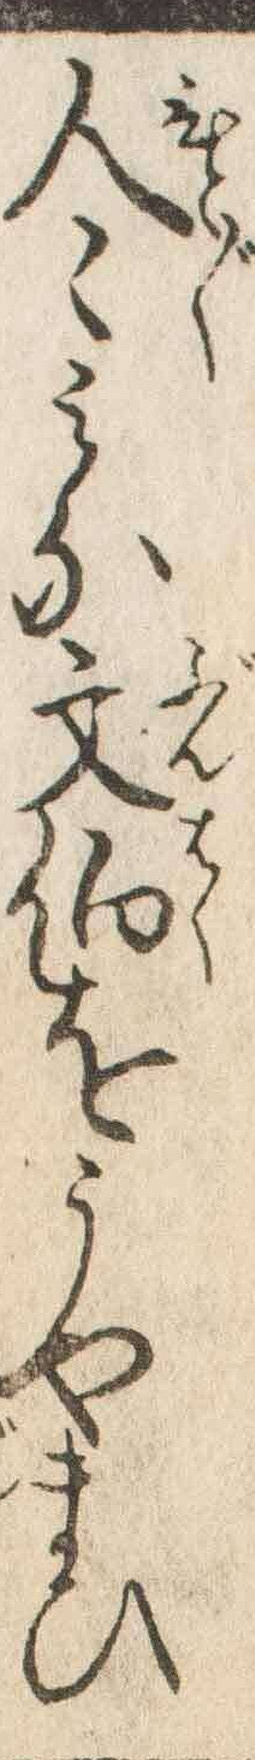人々みな文伯をうやまひ
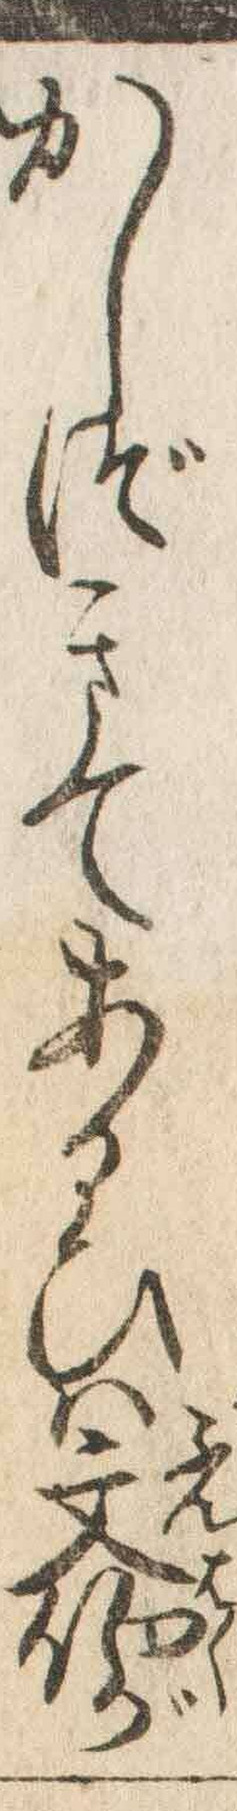かしづきてあるひは文伯が
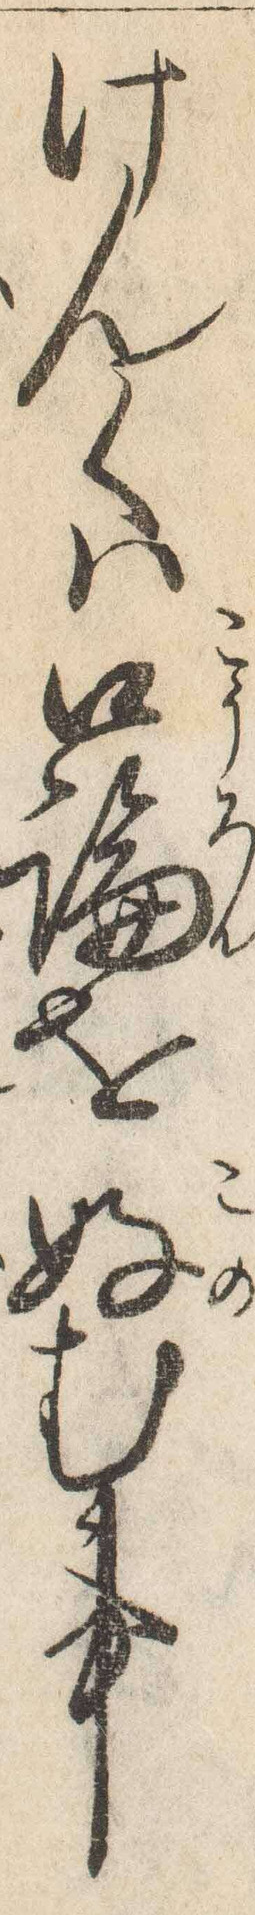けんくは口論を好む事
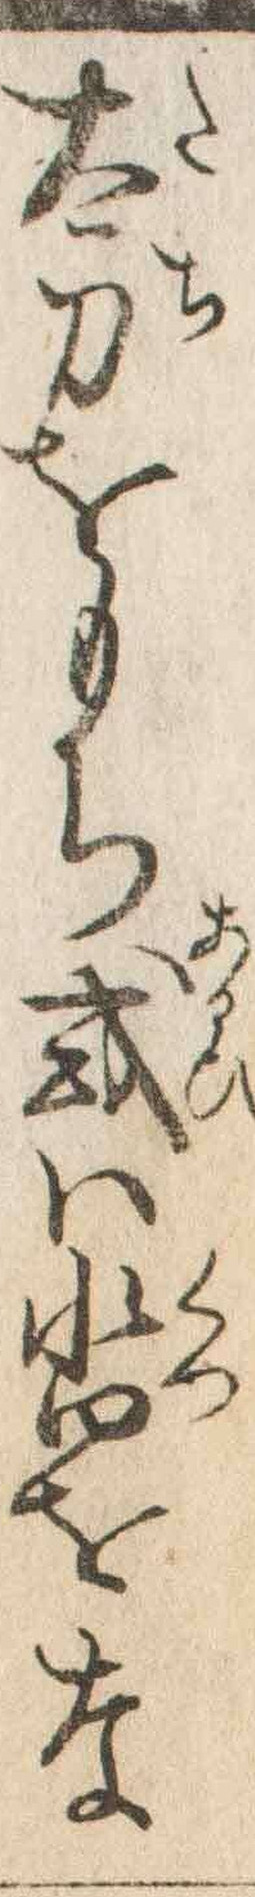太刀をもち或は沓をな
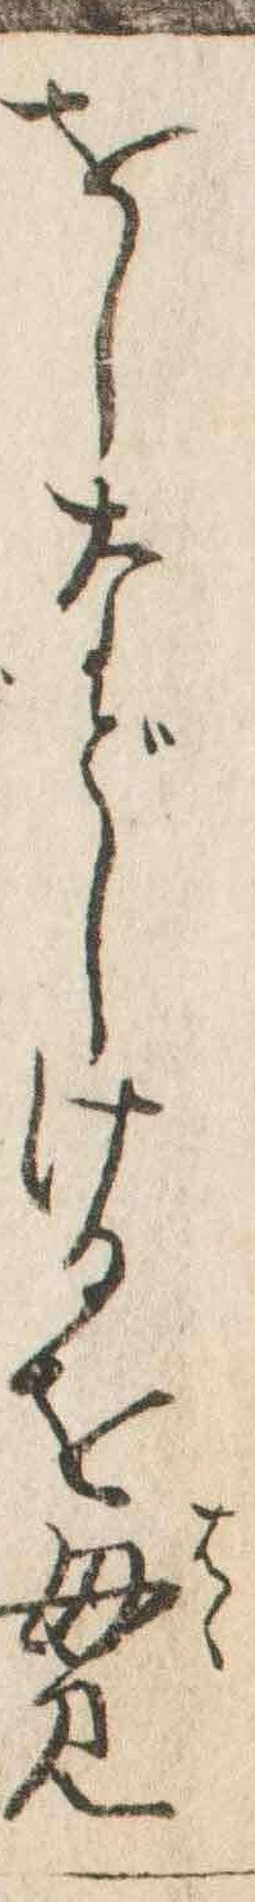をしなどしけるを母見
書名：撫育草
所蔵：東京学芸大学附属図書館 国文学研究資料館
